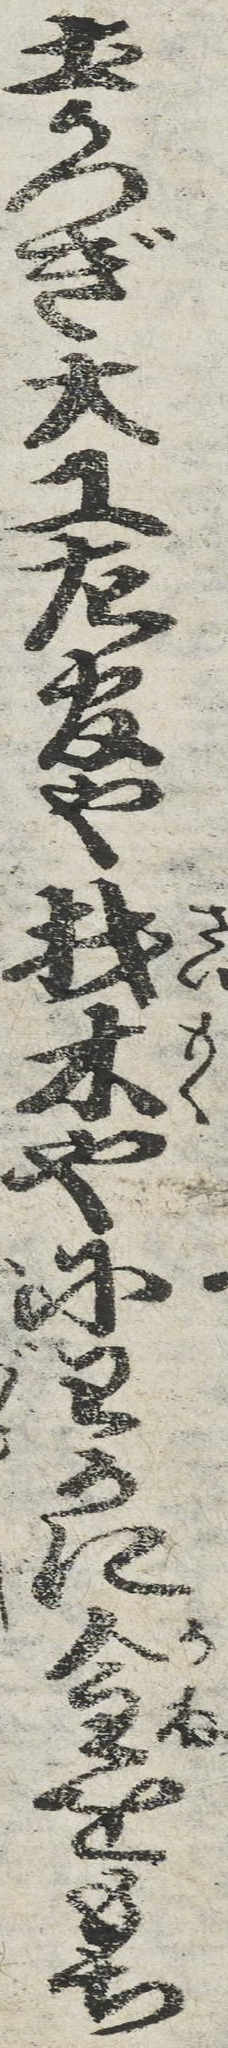土かつぎ大工左官や材木やにわかに金をもち
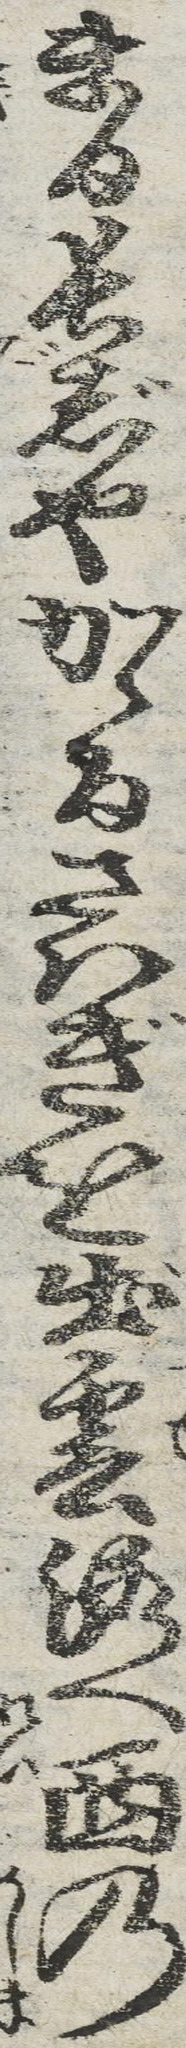まる長じやかゝるさはぎを出雲路へ西の
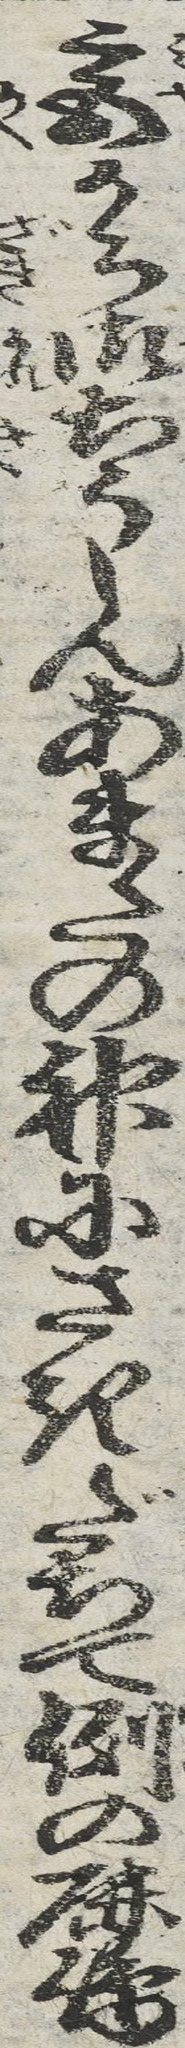宮から御ちうしんあまたの神にさきだちて例の鹿嶋
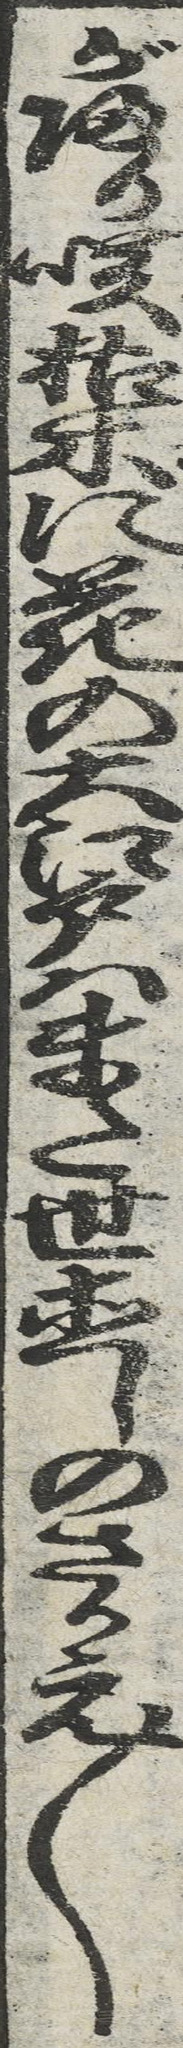が帰り咲枯木に花の大江戸はまた世直しのさかえ〳〵
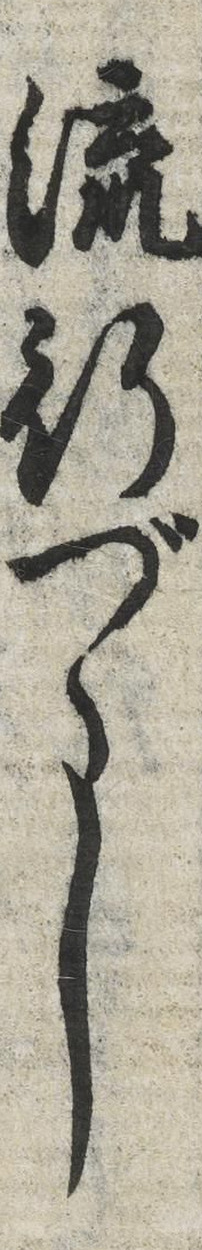流行づくし
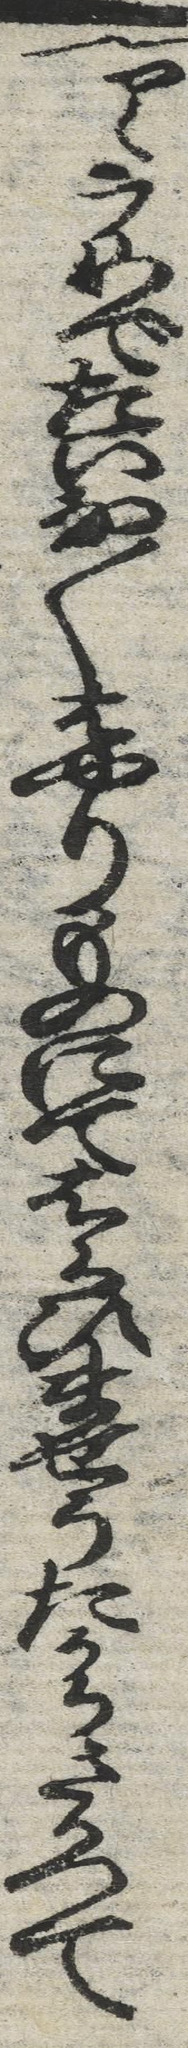〽アヽラめでたいな〳〵はやりものにてはらひませうたからさかつて
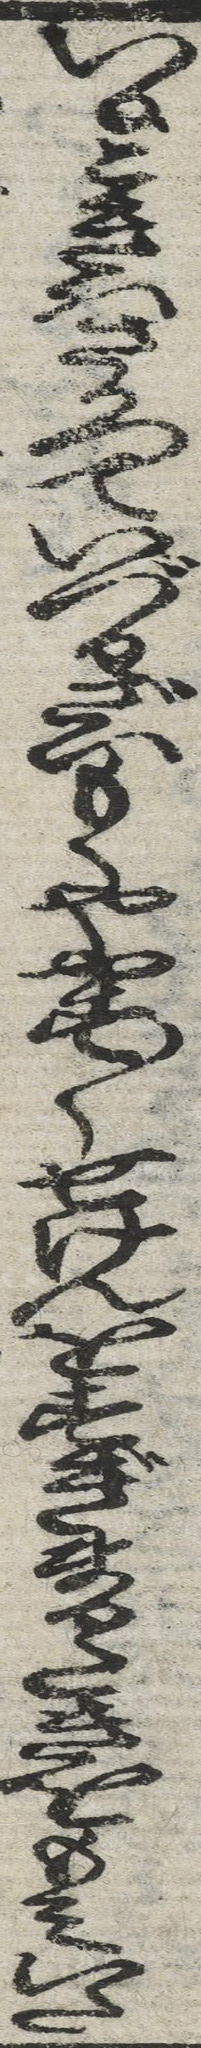いるときはさかつていづるざいもくややす〳〵せけんをすぎまるたきをもみいた
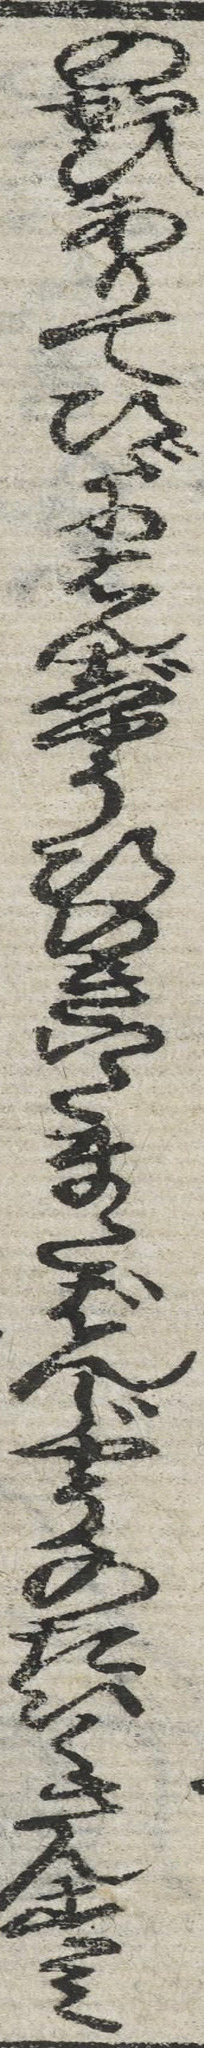のかひありてひゞにはんじやうひのきいたまたばんじやうのたいくさんすみ
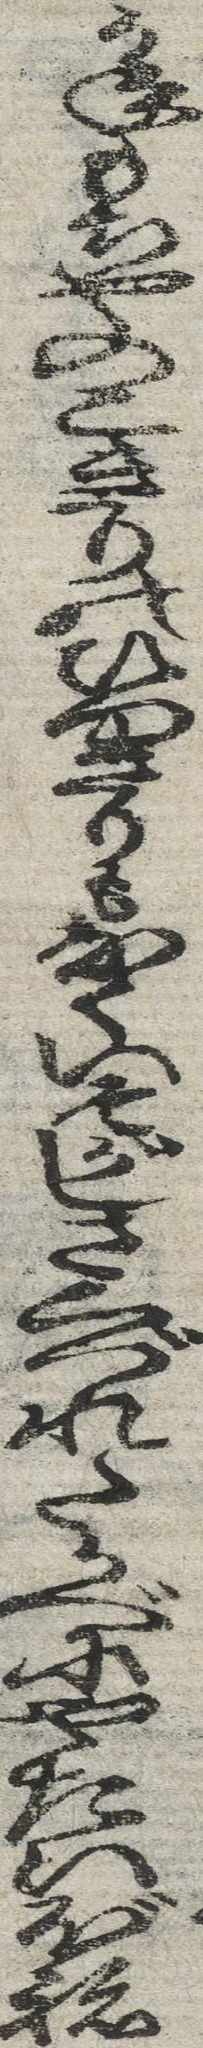かねもちやのこきりのひつきりもなくいそがしさくづれたかべにやたいぼね
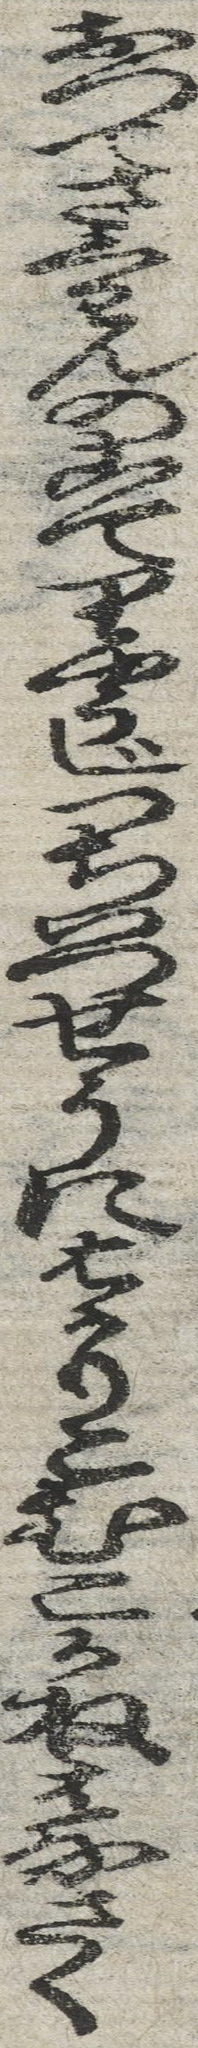おつてさくわんのこてりやうじつちいつせうにはかりこむこかねはなさく
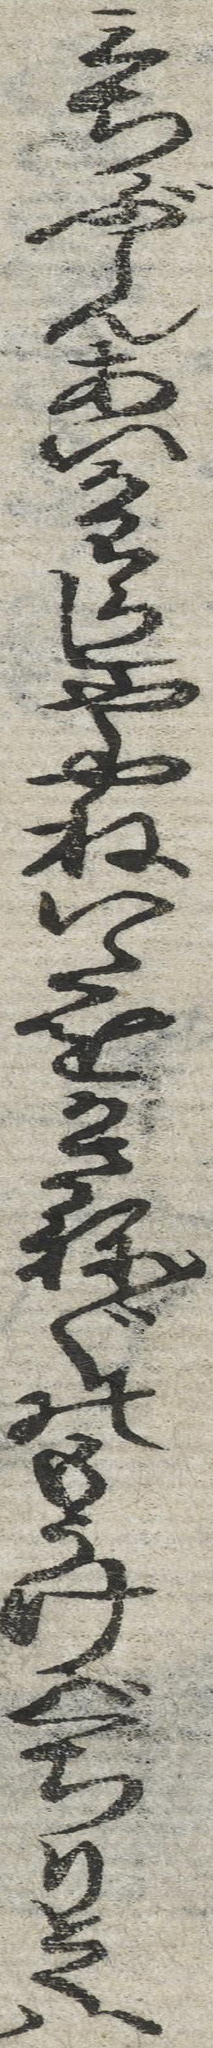みちぶしんあいかわらしややねいたをかさね〴〵のもうけぐちりとくは
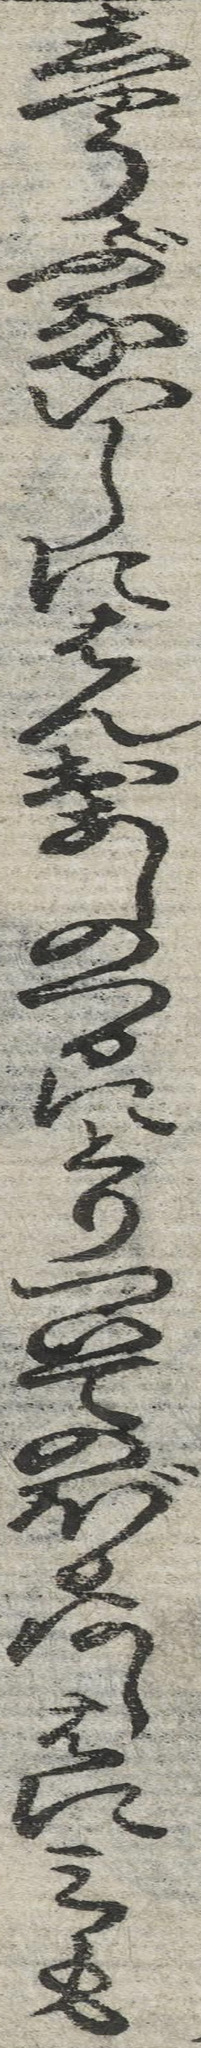しやうぶないしにはんおあしのつるにとりついてのぼるあしはにみも
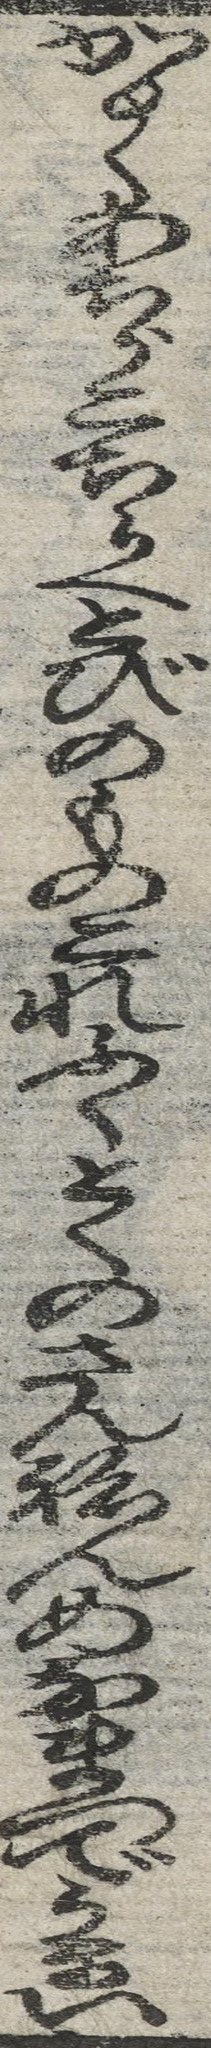かるくあちらこちらへとびのものこれふくとくのさんねんめなまつでうまい
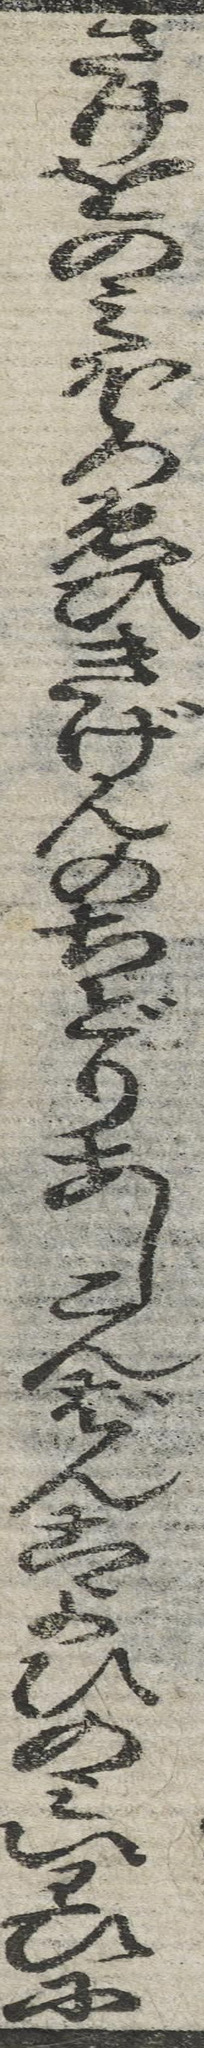さけをのみほろゑひきげんのちどりあしこんばんこよひのみいわひに
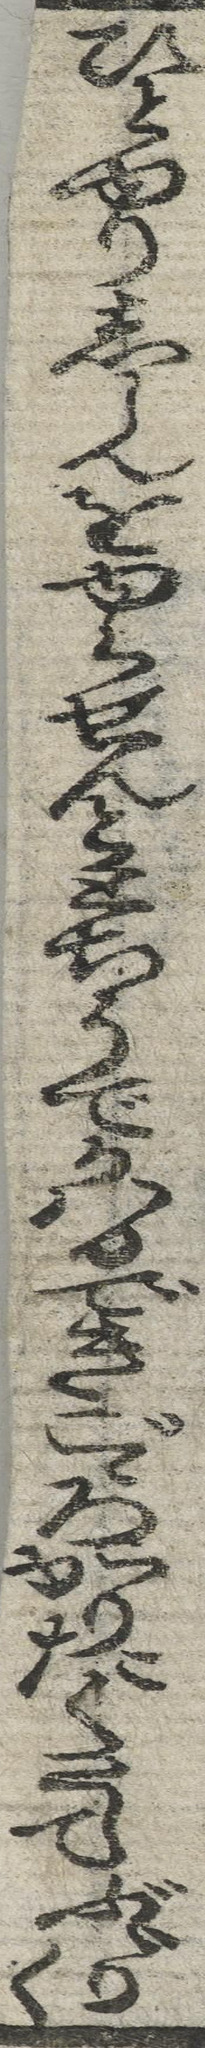ひとゆりししんをゆらせんととちうでかはるできごゝろかりたくさしてぶらり〳〵

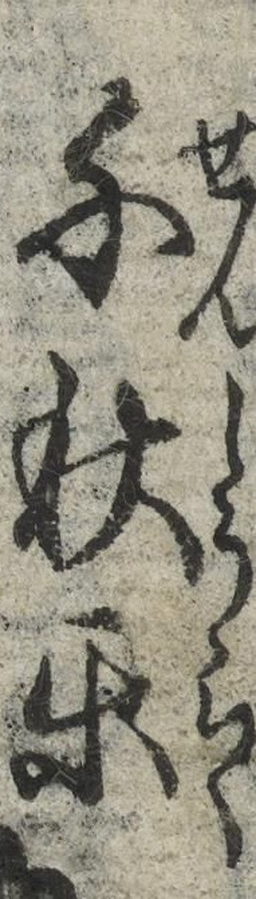千秋楽
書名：地震やくはらひ
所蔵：東京大学地震研究所図書室 Earthquake Research Institute Library, The University of Tokyo, JAPAN
